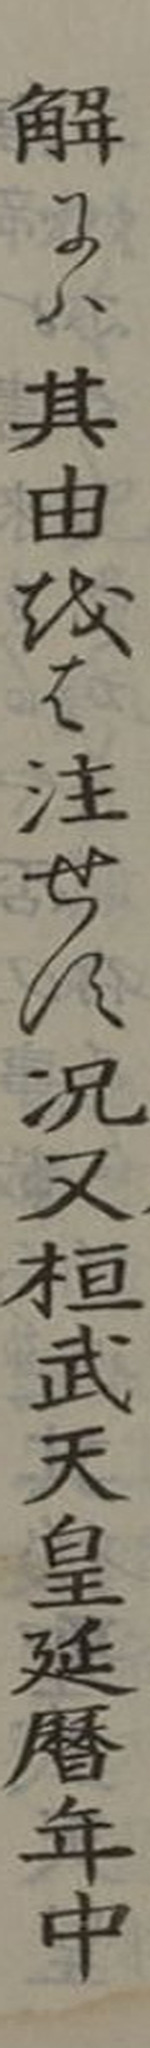解にハ其由をは注せす况又桓武天皇延曆年中
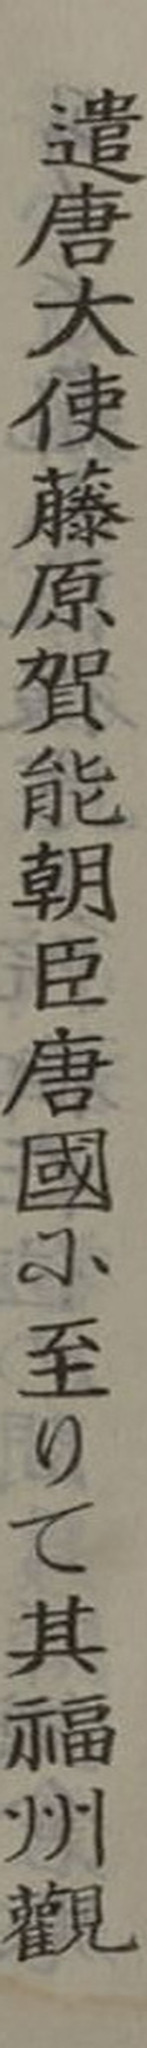遣唐大使藤原賀能朝臣唐國に至りて其福州觀
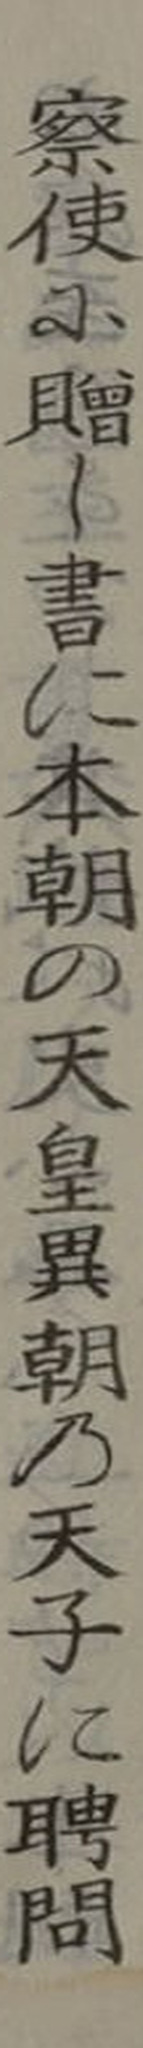察使に贈し書に本朝の天皇異朝の天子に聘問
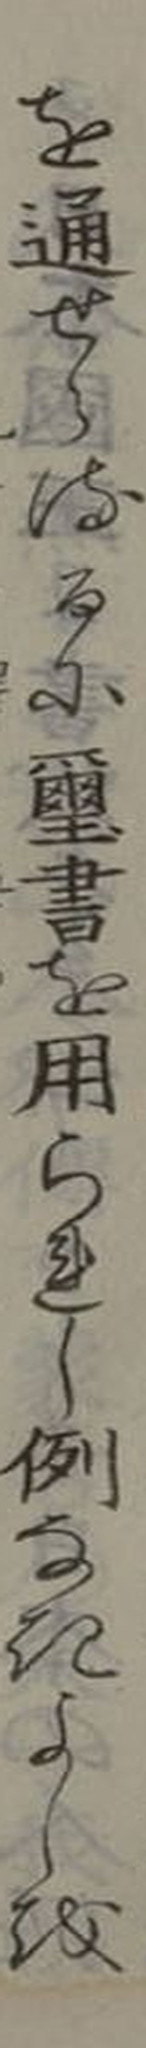を通せらるるに璽書を用られし例なきよしを
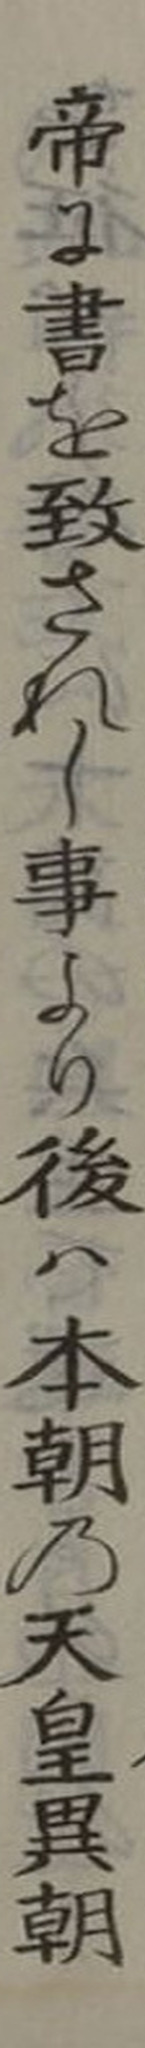帝に書を致されし事より後ハ本朝の天皇異朝
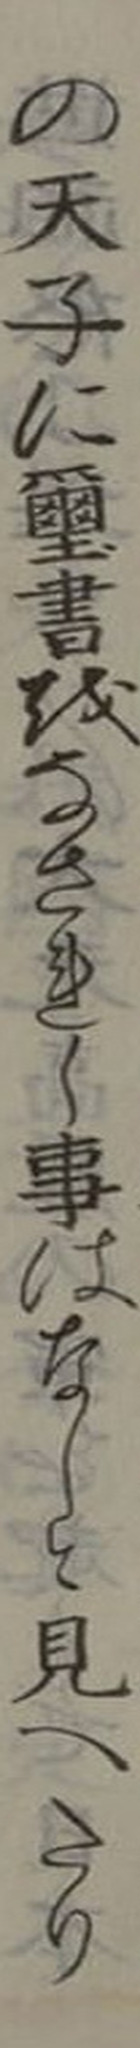の天子に璽書をなされし事はなしと見へたり
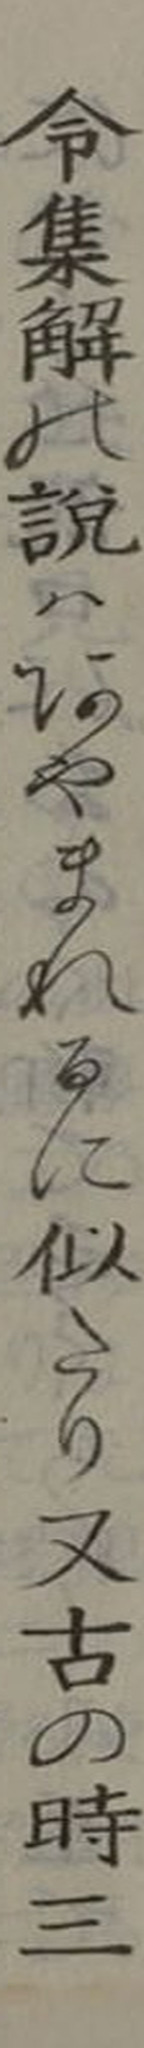令集解の說ハあやまれるに似たり又古の時三
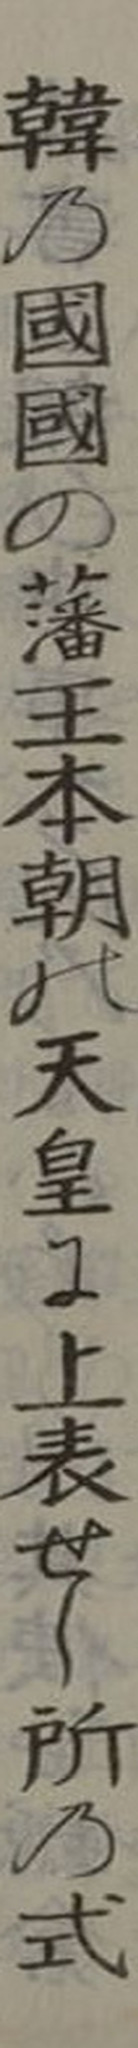韓の國國の藩王本朝の天皇に上表せし所の式
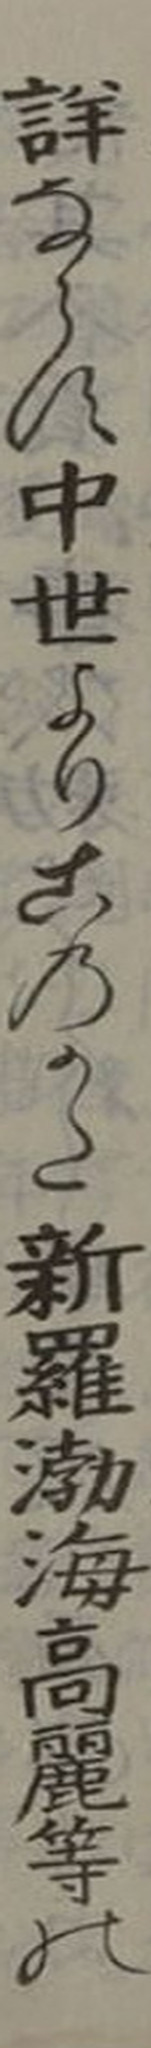詳ならす中世よりこのかた新羅渤海高麗等の
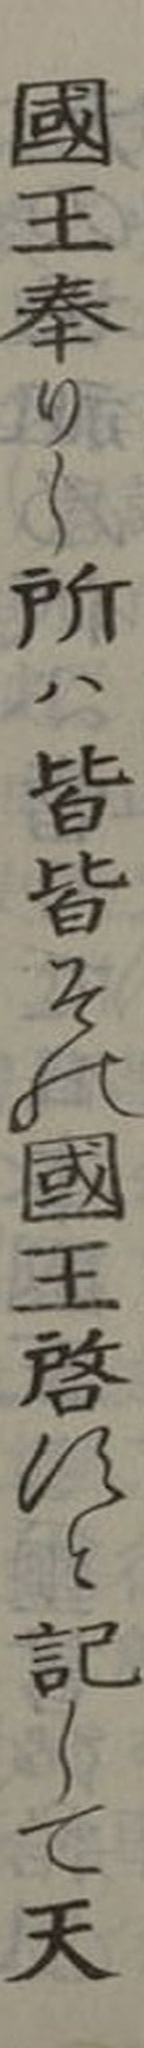國王奉りし所ハ皆皆その國王啓すと記して天
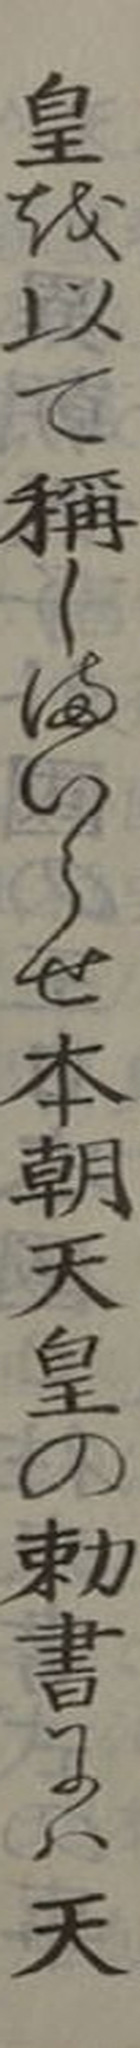皇を以て稱しまいらせ本朝天皇の勅書にハ天
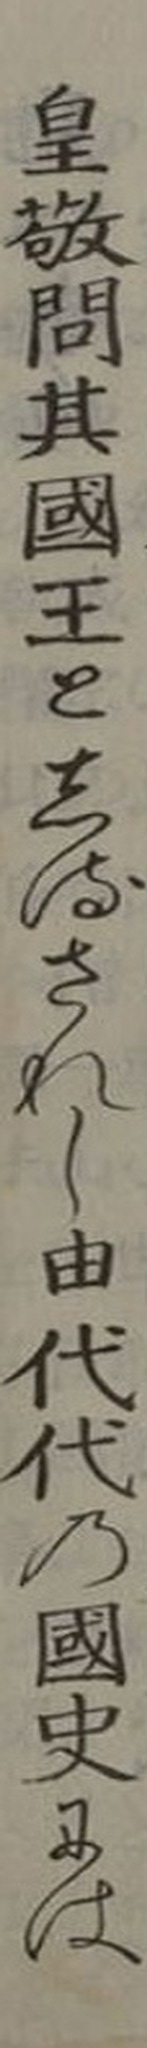皇敬問其國王としるされし由代代の國史には

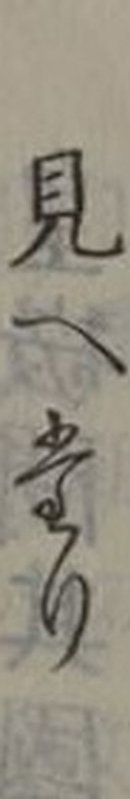見へたり
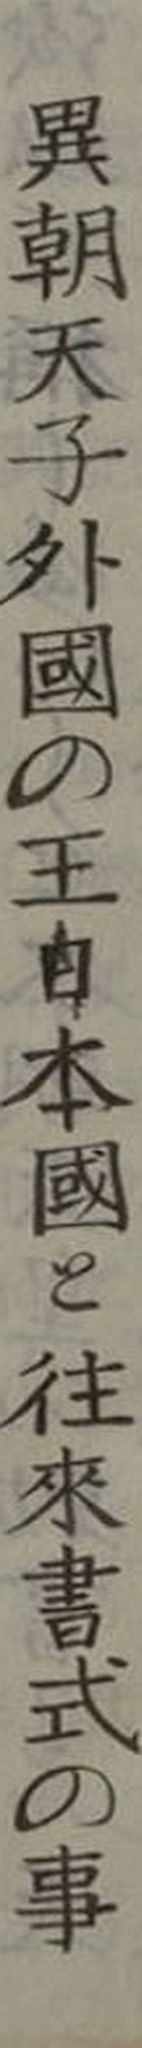異朝天子外國の王日本國と往來書式の事
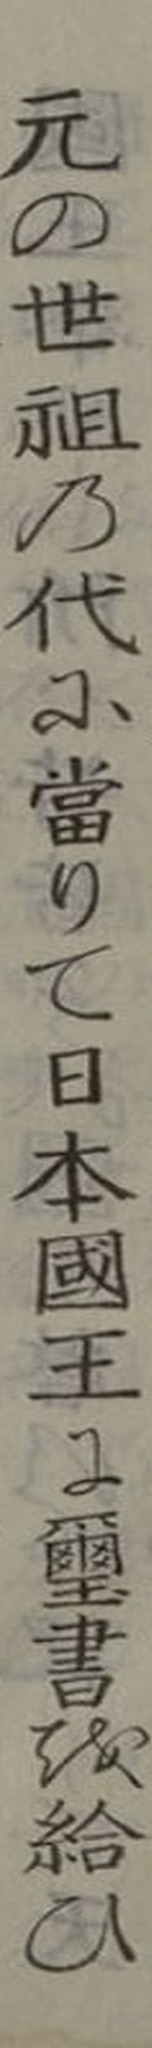元の世祖の代に當りて日本國王に璽書を給ひ
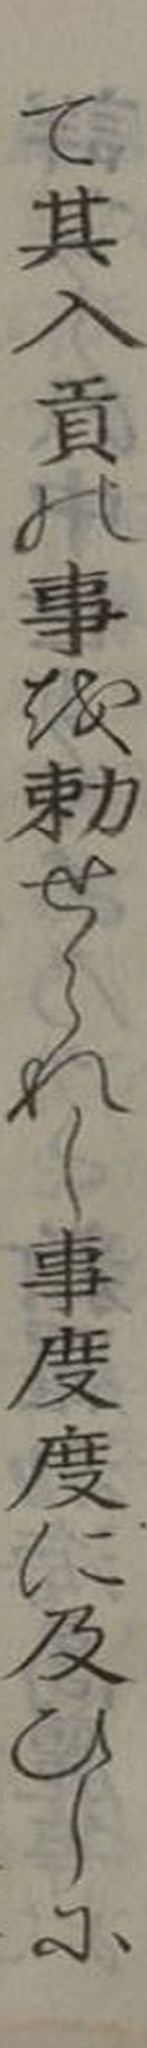て其入貢の事を勅せられし事度度に及ひしに
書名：骨董録
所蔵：University of the Ryukyus Library
